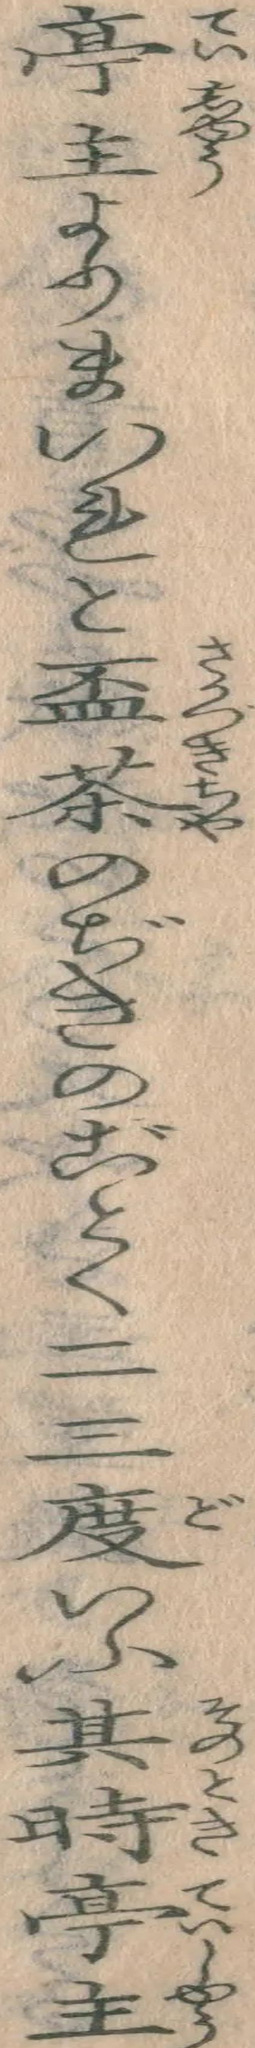亭主よりまいれと盃茶のぢきのごとく二三度いふ其時亭主
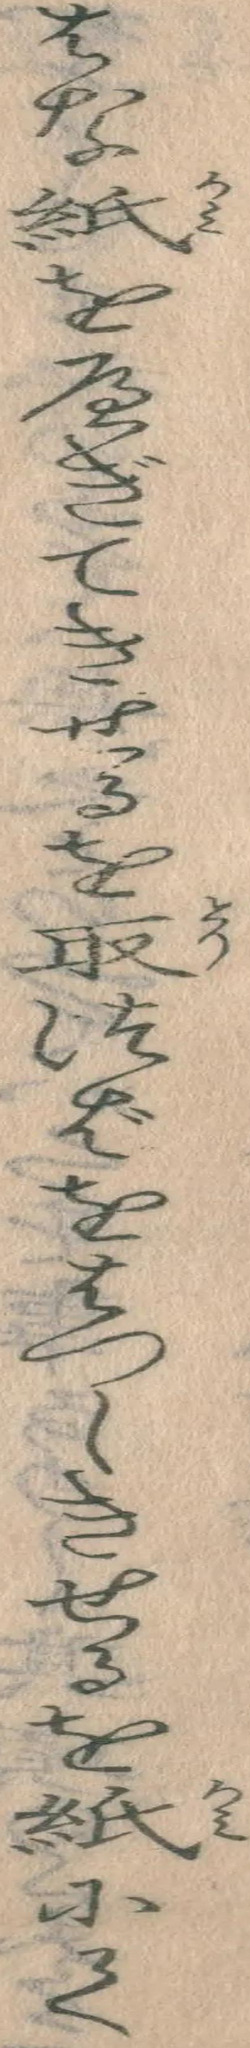はな紙をへぎてきせるを取つばをはつしきせるを紙にて
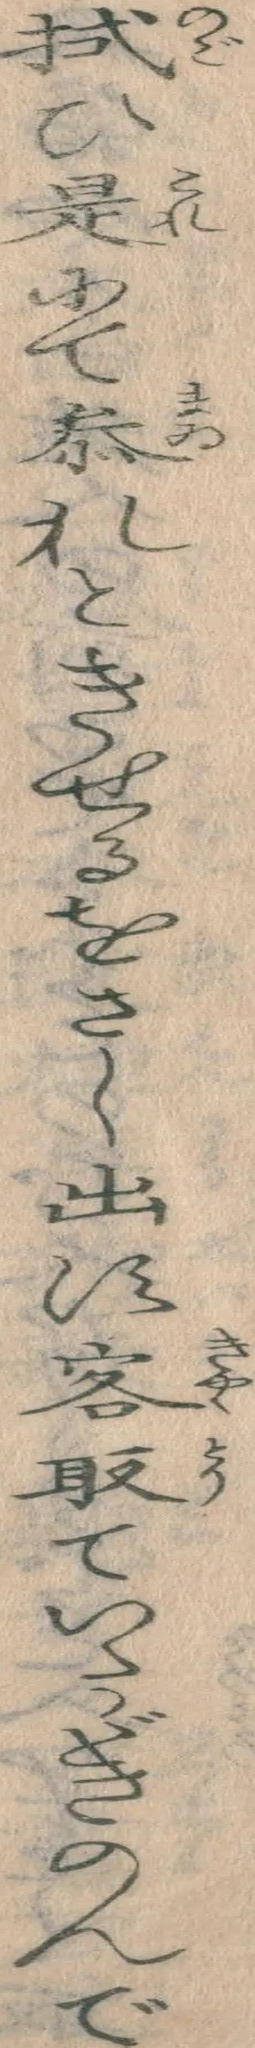拭ひ是にて参れときせるをさし出す客取ていたゞきのんで
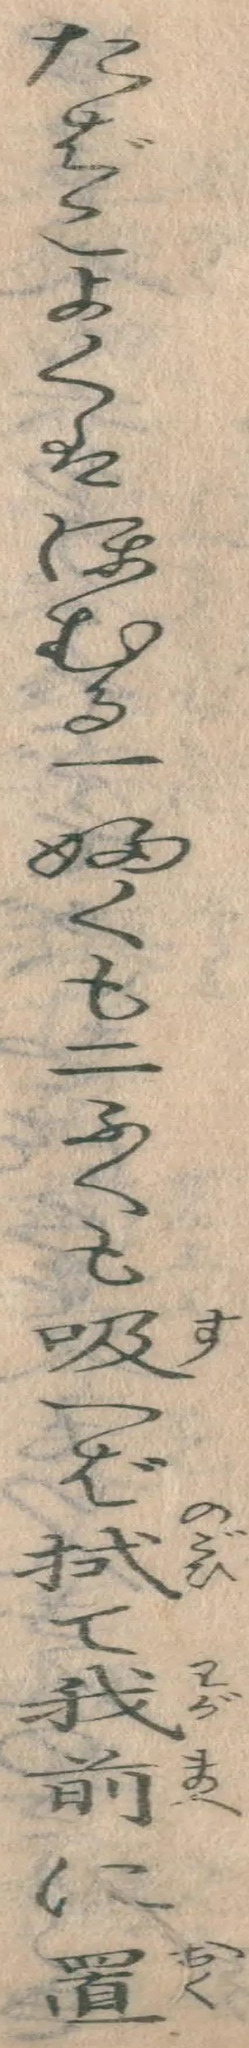たばこよくはほむる一ふくも二ふくも吸へば拭て我前に置
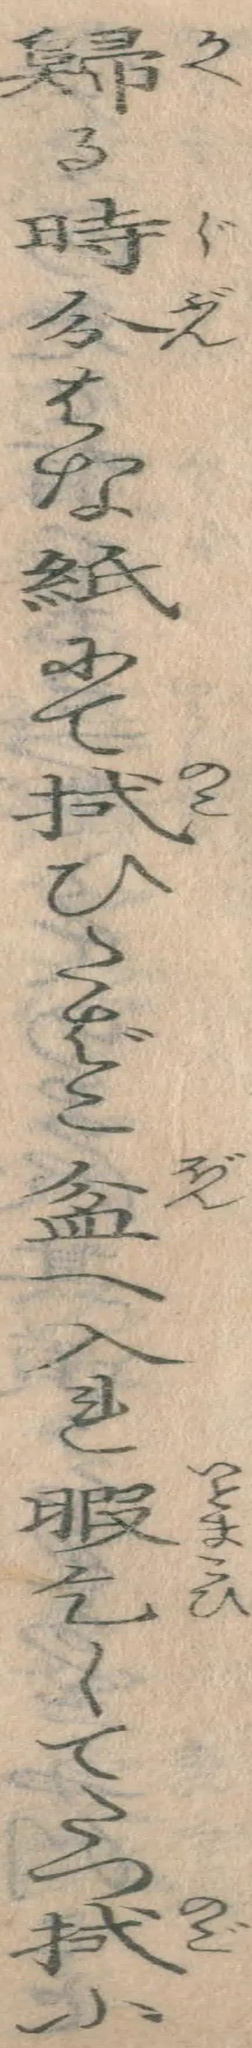帰る時分はな紙にて拭ひたばこ盆へ入れ暇乞してたつ拭ふ
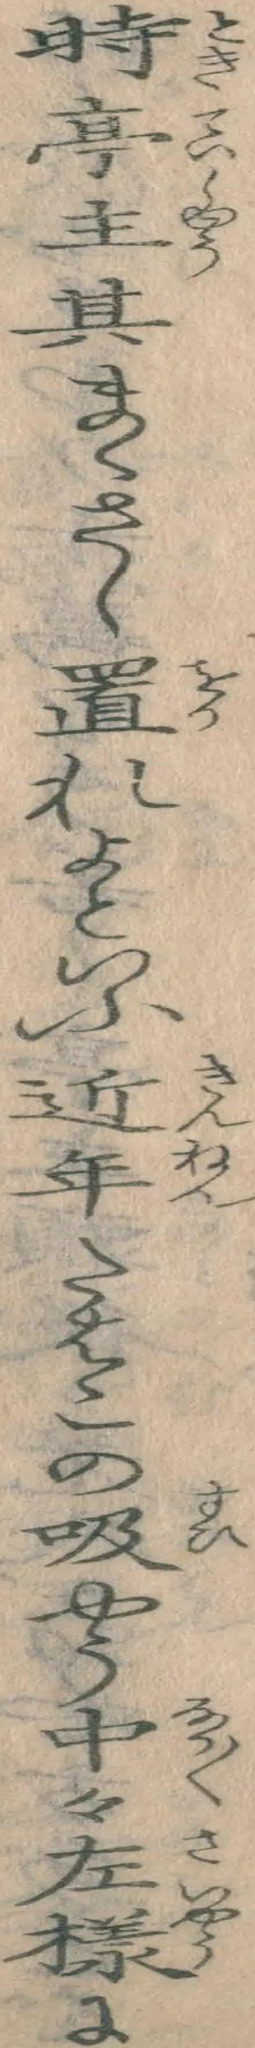時亭主其まゝさし置れよといふ近年たはこの吸やう中々左様に

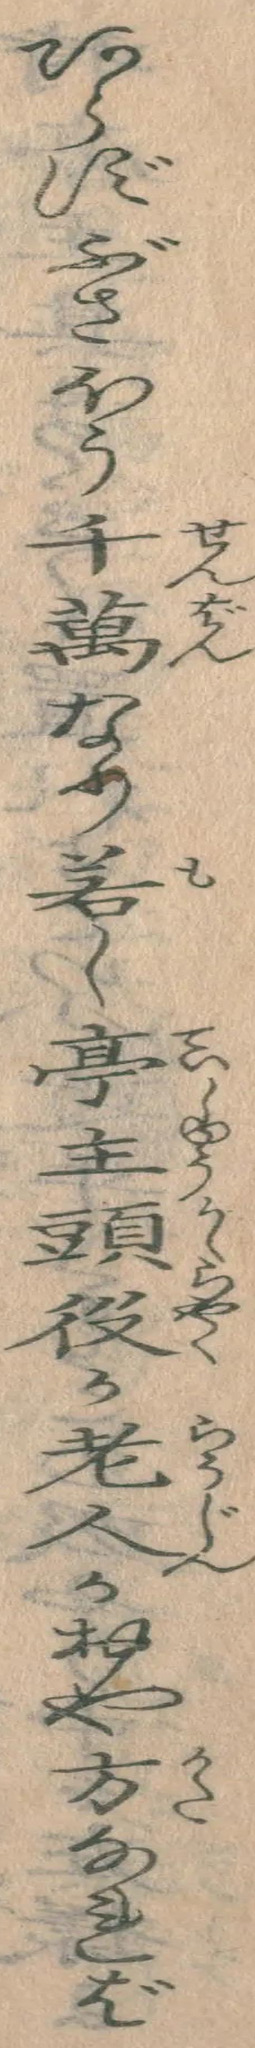あらずぶさほう千万なり若し亭主頭役か老人かおや方なれば
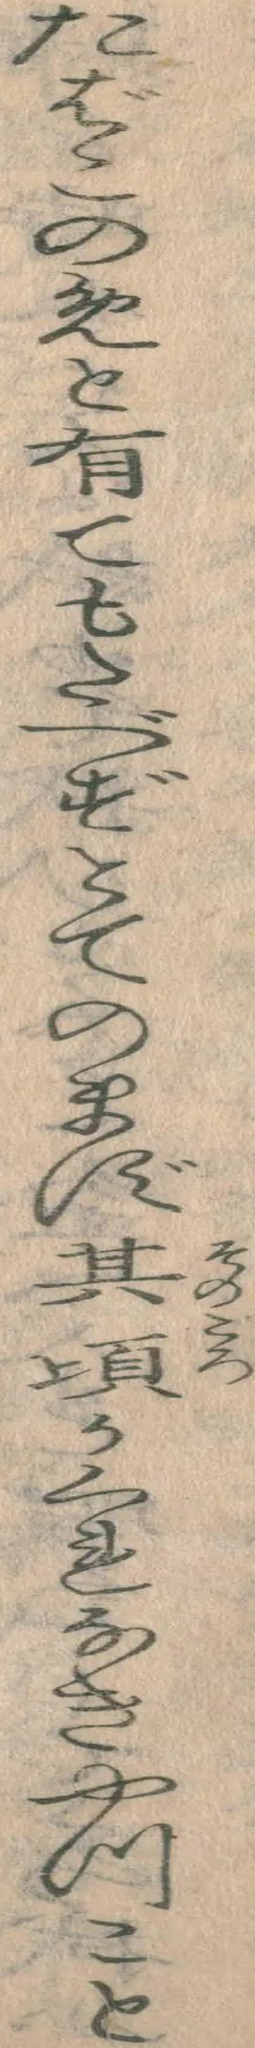たばこのめと有てもたべずとてのまず其頃かくれなきやつこと
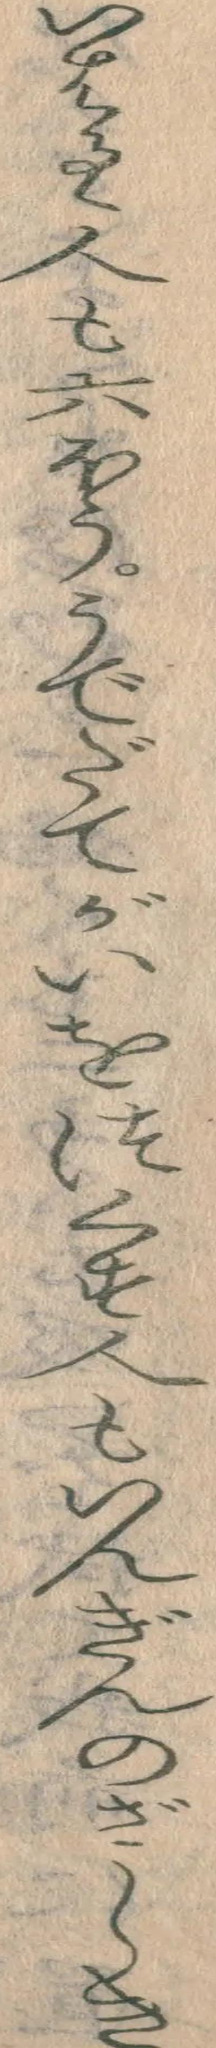いはるゝ人も六ほう。うでだてがいをつくす人もいんぎんのざしき
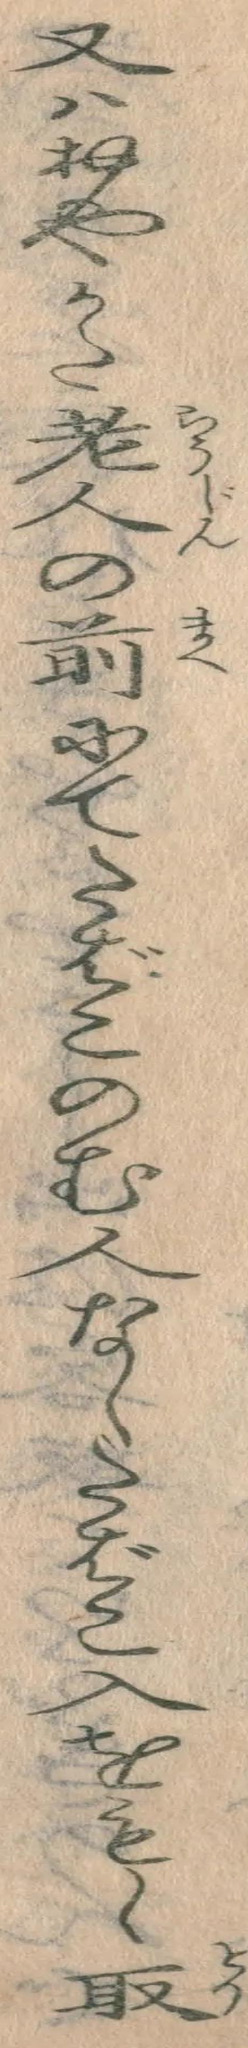又はおやかた老人の前にてたばこのむ人なしたばこ入をもし取
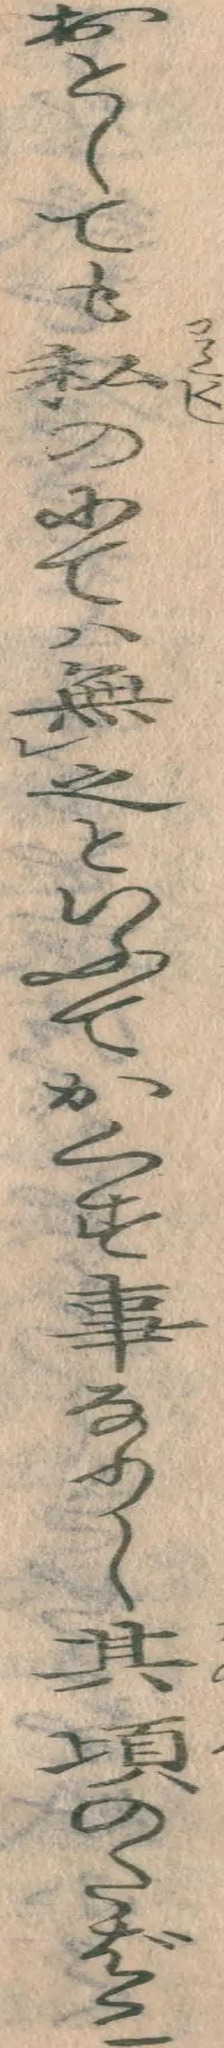おとしても私のにては無之といふてかくす事なりし其頃のたばこ
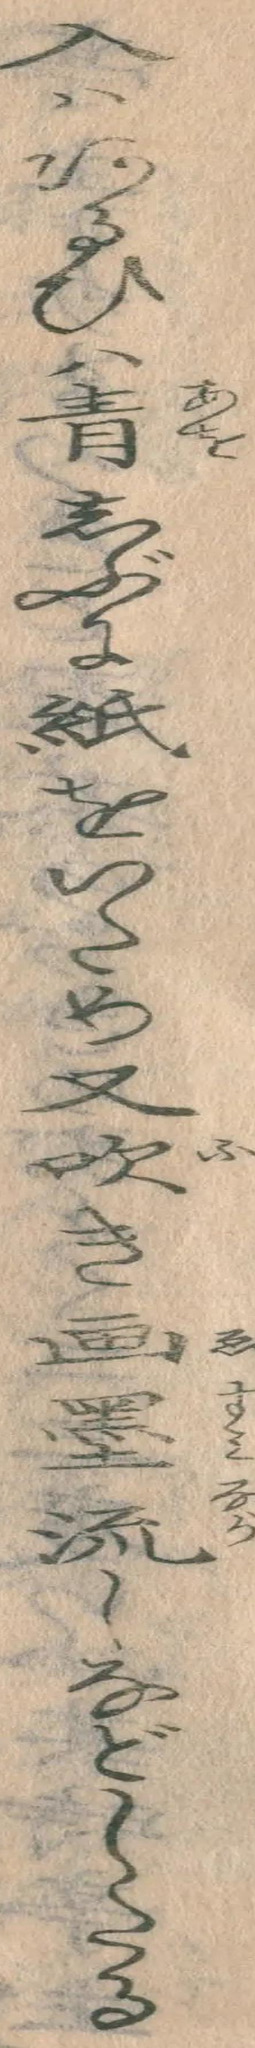入はあるひは青しぶに紙をいため又吹き画墨流しなどしたる
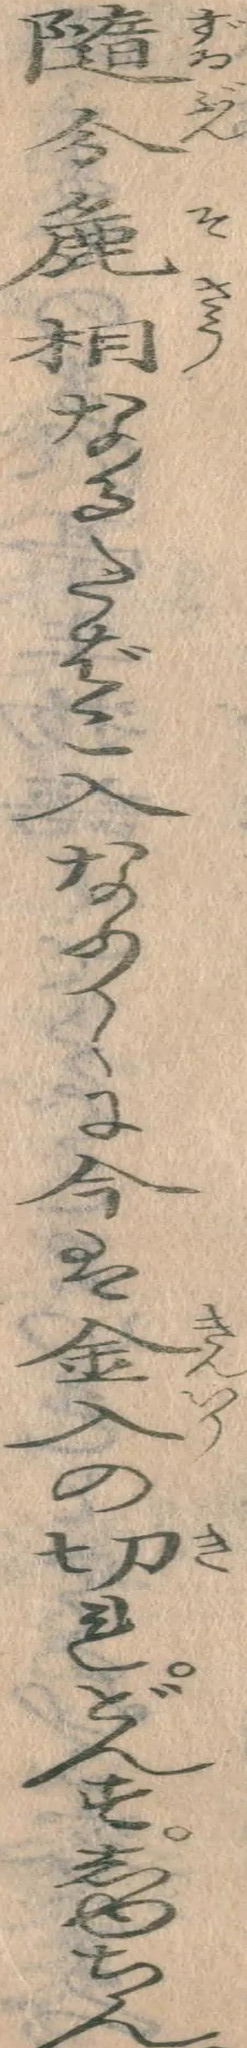随分麁相なるたばこ入なりしに今は金入の切れ。どんす。しゆちん。
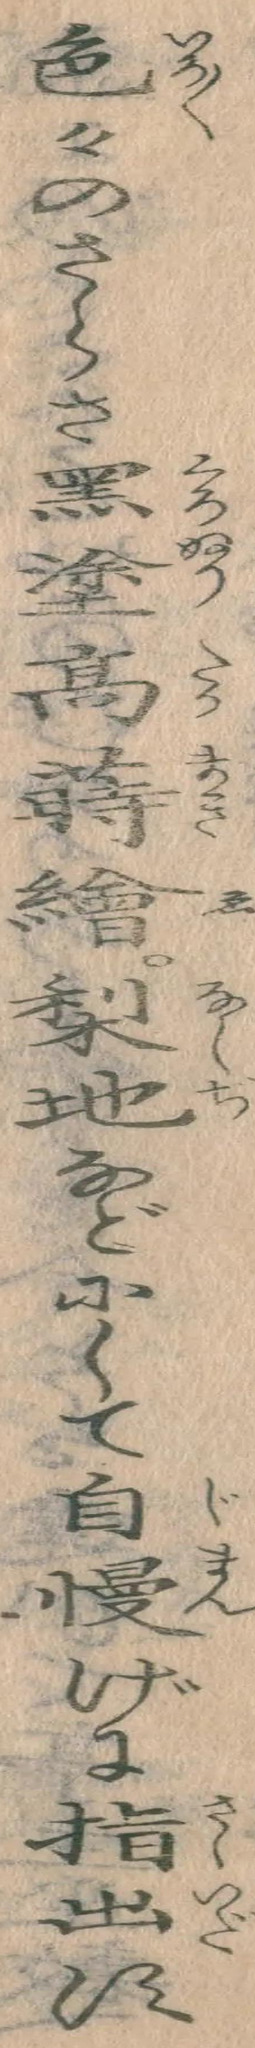色々のさらさ黒塗高蒔絵。梨地などにして自慢げに指出す
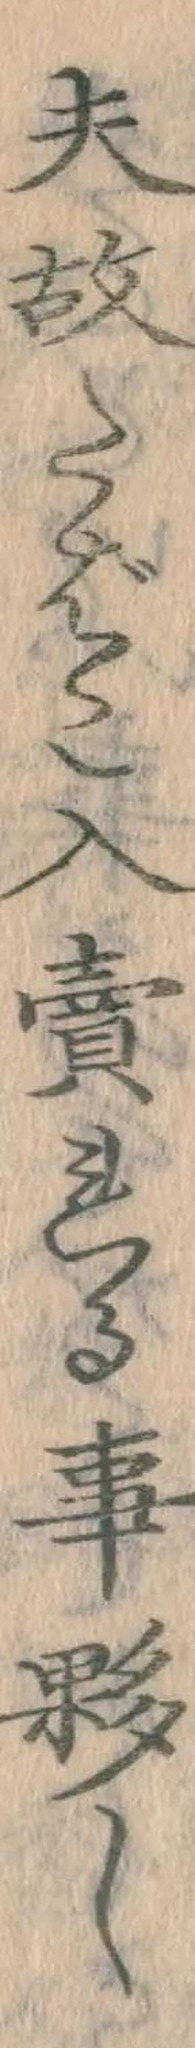夫故たばこ入売れる事夥し
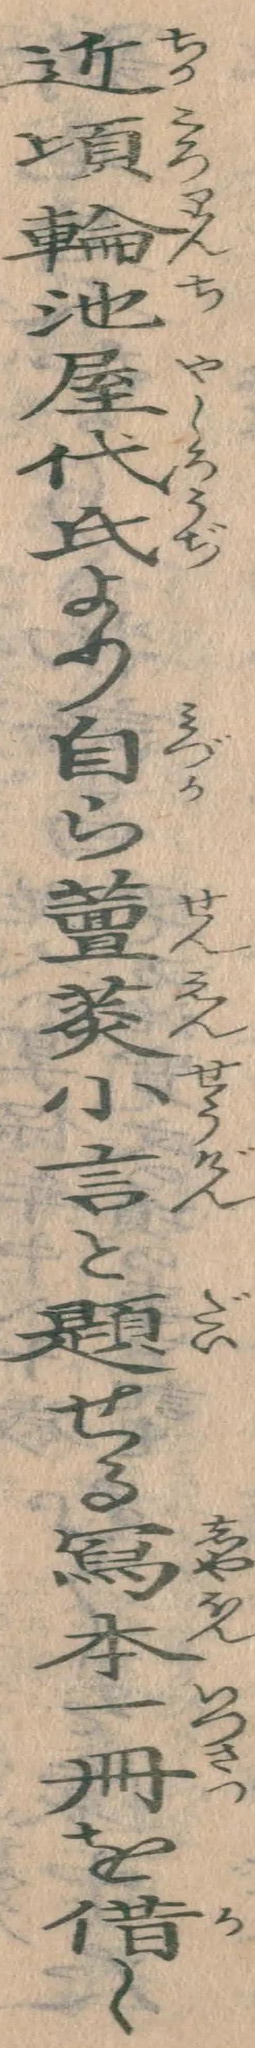近頃輪池屋代氏より自ら䕊菼小言と題せる写本一冊を借し
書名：目さまし草
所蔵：国立国会図書館 National Diet Library, JAPAN
